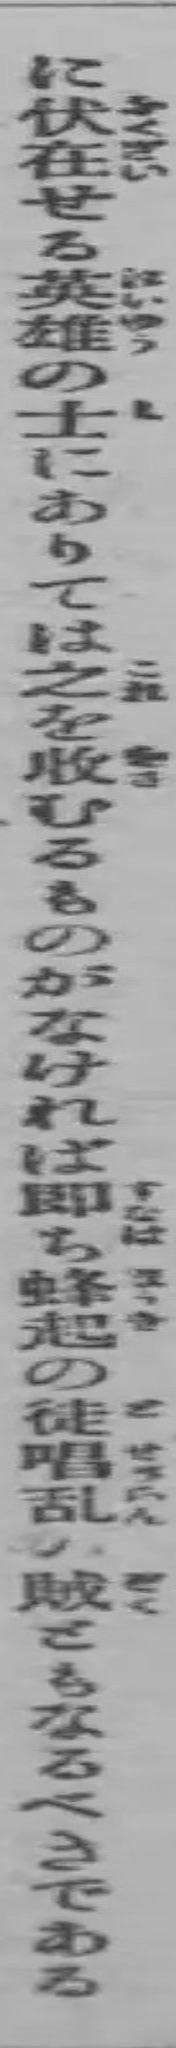に伏在せる英雄の士にありては之を収むるものがなければ即ち蜂起の徒唱乱の賊ともなるべきである
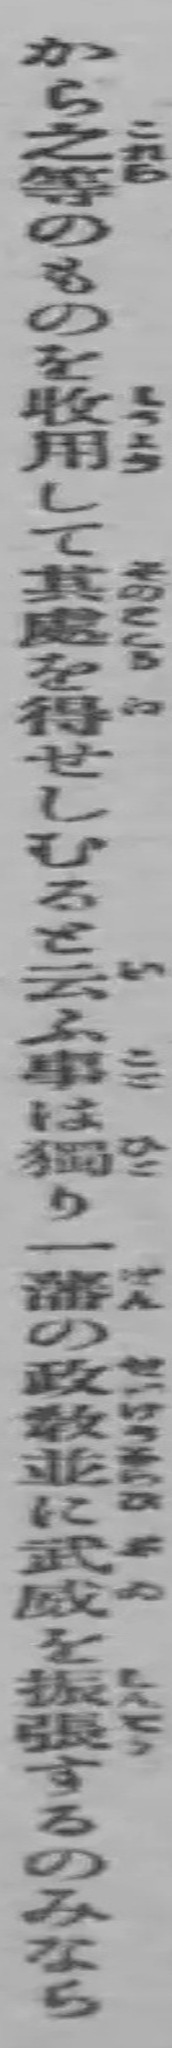から之等のものを収用して其処を得せしむると云ふ事は独り一藩の政教並に武威を振張するのみなら
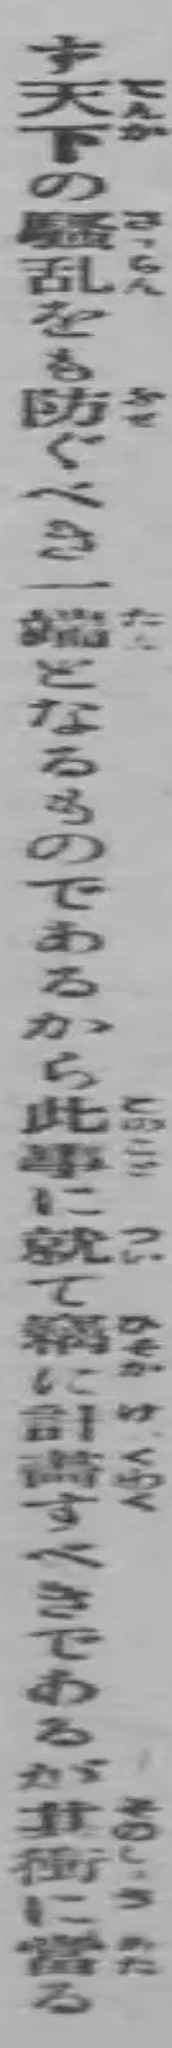ず天下の騒乱をも防ぐべき一端となるものであるから此事に就て竊に計画すべきであるが其衝に当る
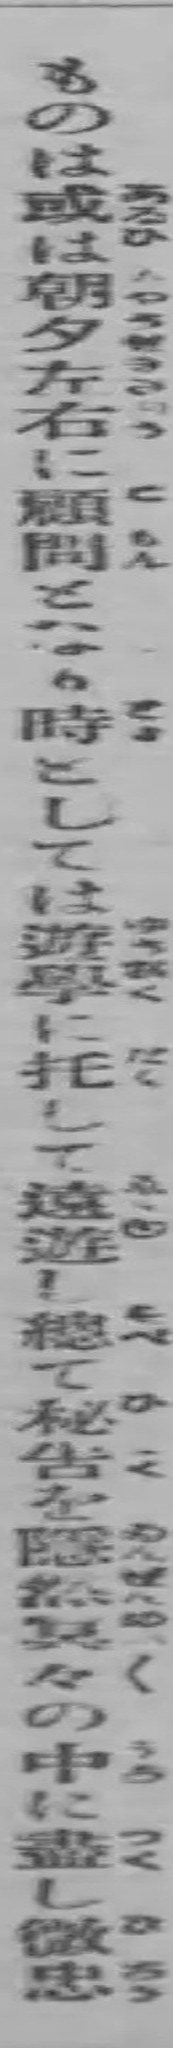ものは或は朝夕左右に顧問となり時としては遊学に托して遠遊し総て秘告を隠然冥々の中に尽し微忠
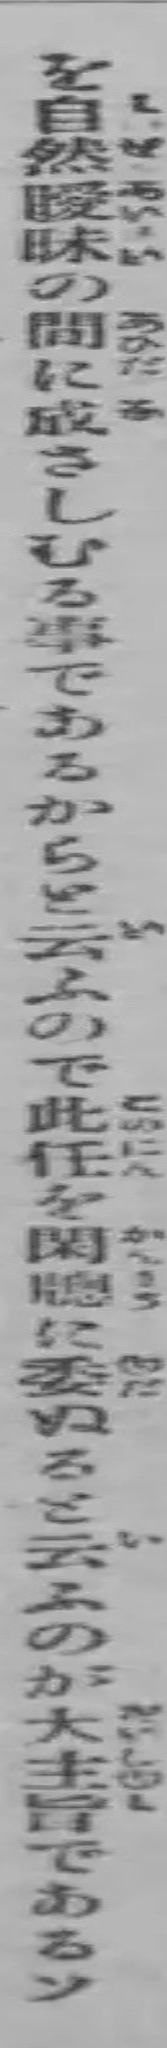を自然曖昧の間に成さしむる事であるからと云ふので此任を閑牕に委ぬると云ふのが大主旨であるソ
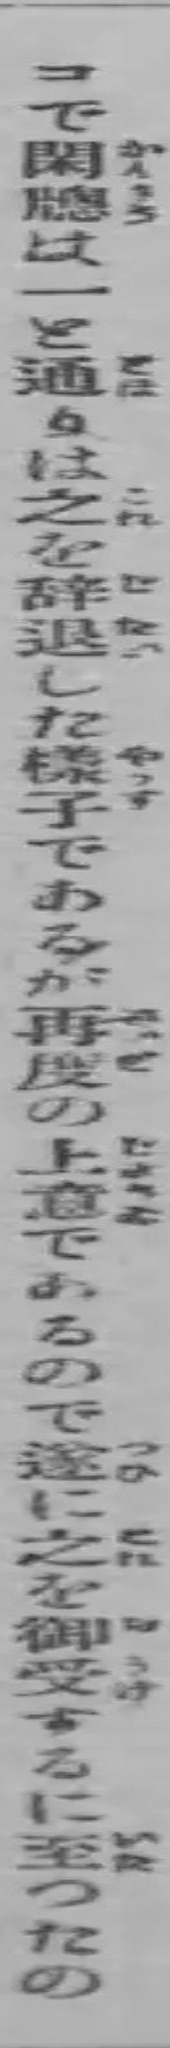コで閑牕は一と通りは之を辞退した様子であるが再度の上意であるので遂に之を御受するに至つたの
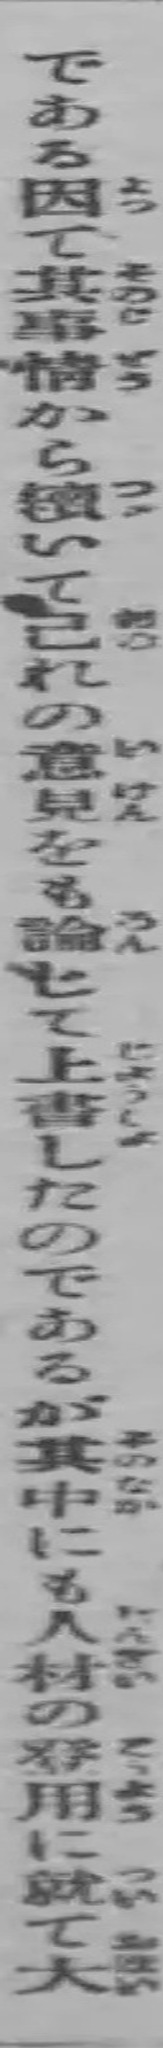である因て其事情から続いて己れの意見をも論じて上書したのであるが其中にも人材の登用に就て大
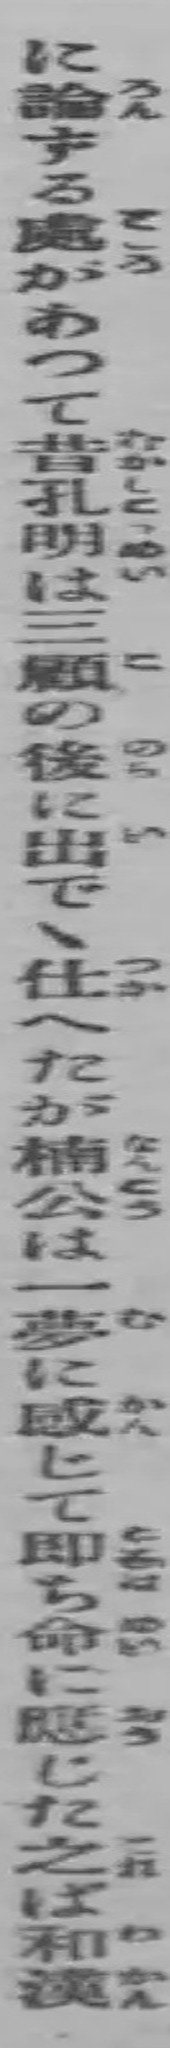に論ずる処があつて昔孔明は三顧の後に出でゝ仕へたが楠公は一夢に感じて即ち命に応じた之は和漢
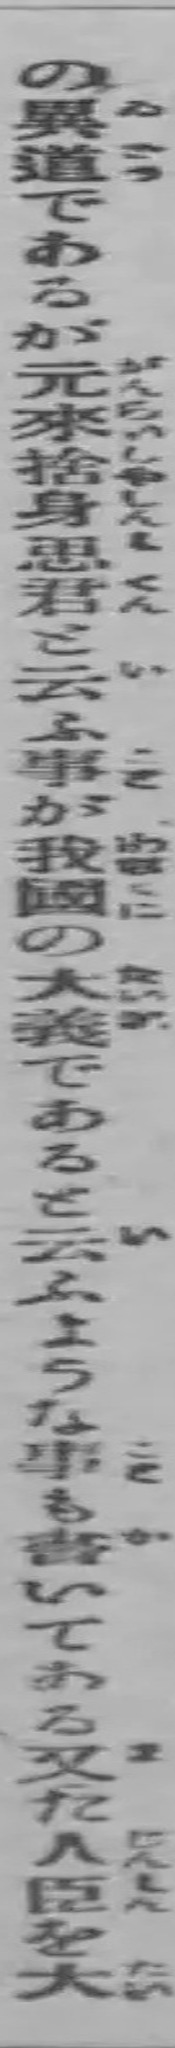の異道であるが元来捨身思君と云ふ事が我国の大義であると云ふような事も書いてある又た人臣を大
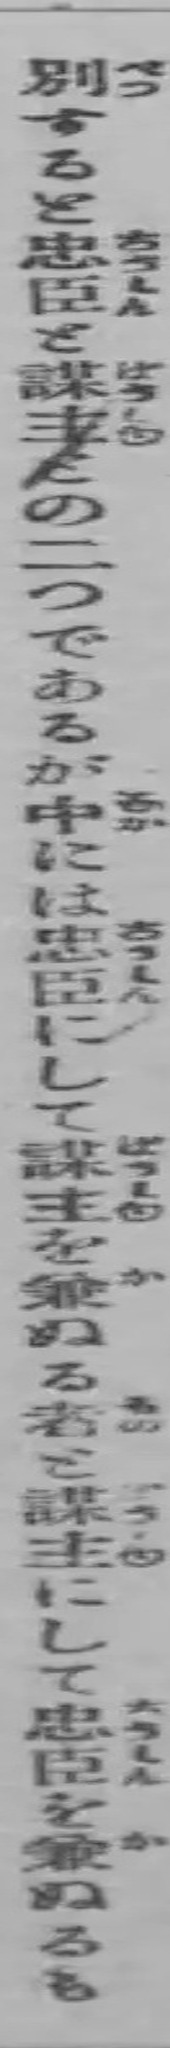別すると忠臣と謀主との二つであるが中には忠臣にして謀主を兼ぬる者と謀主にして忠臣を兼ぬるも
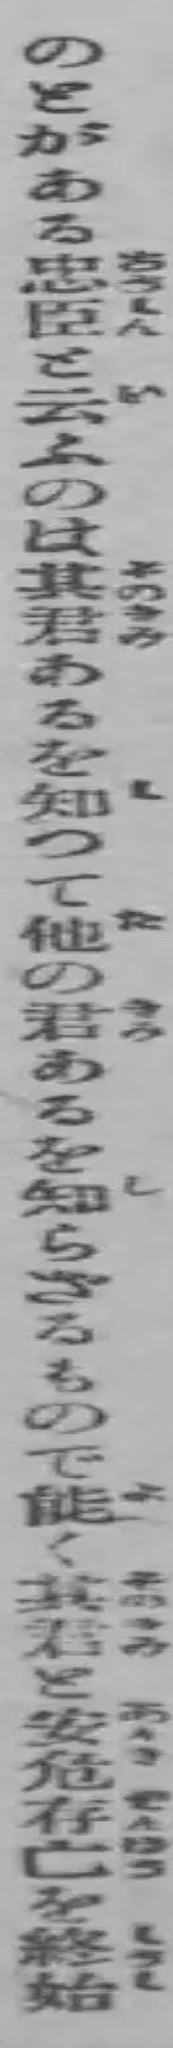のとがある忠臣と云ふのは其君あるを知つて他の君あるを知らざるもので能く其君と安危存亡を終始
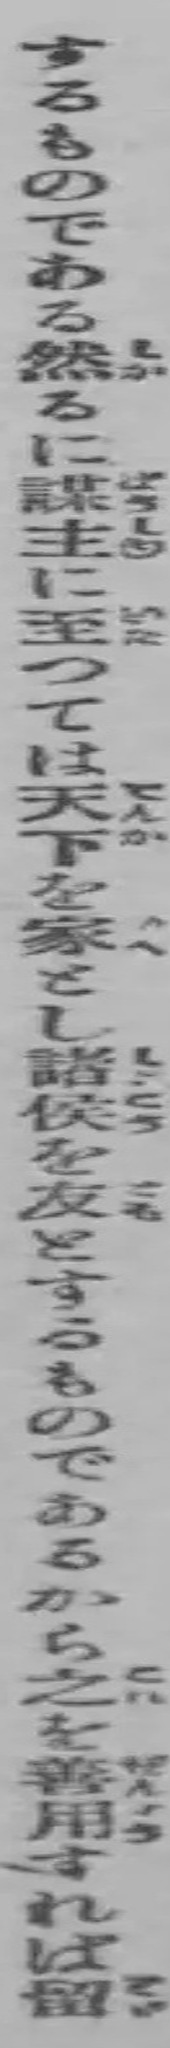するものである然るに謀主に至つては天下を家とし諸侯を友とするものであるから之を善用すれば留
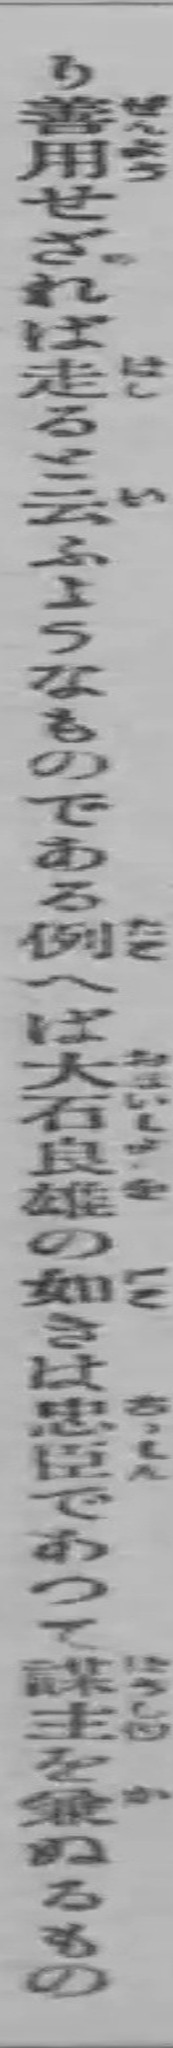り善用せざれば走ると云ふようなものである例へば大石良雄の如きは忠臣であつて謀主を兼ぬるもの
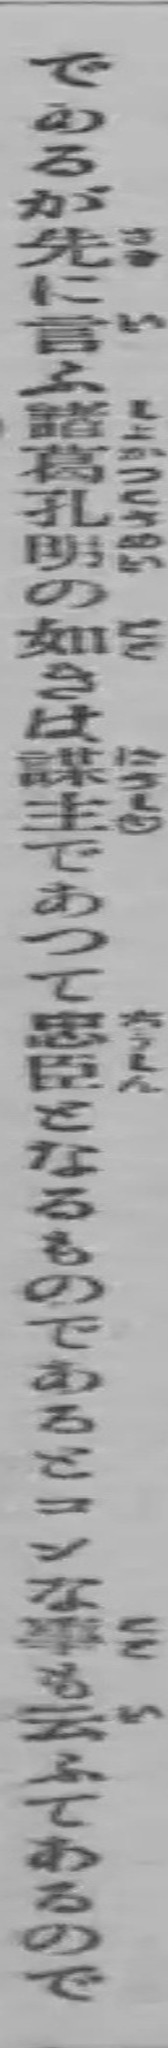であるが先に云ふ諸葛孔明の如きは謀主であつて忠臣となるものであるとコンな事も云ふてあるので
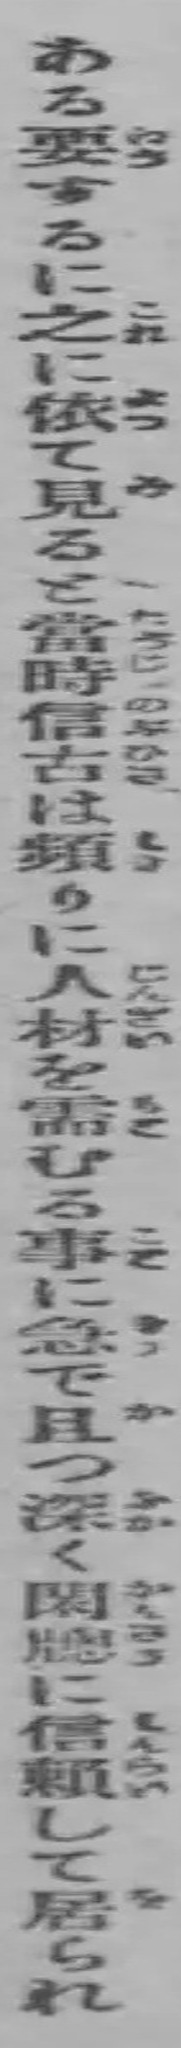ある要するに之に依て見ると当時信古は頻りに人材を需むる事に急で且つ深く閑牕に信頼して居られ
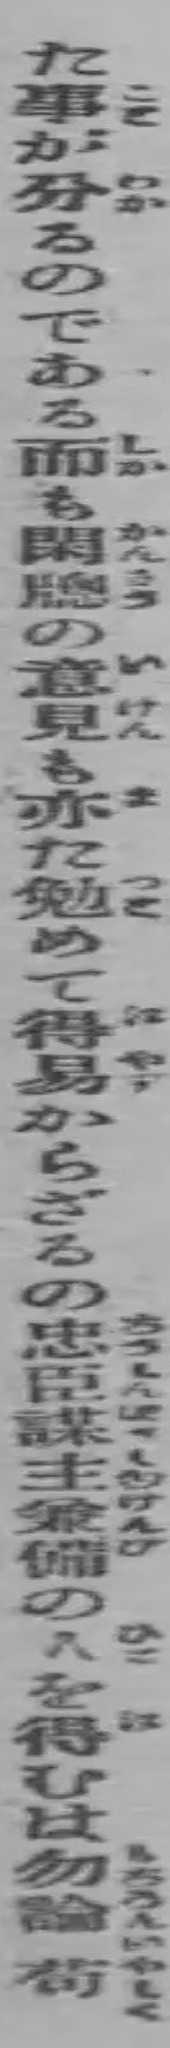た事が分るのである而も閑牕の意見も亦た勉めて得易からざるの忠臣謀主兼備の人を得むは勿論苟
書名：豊橋市史談
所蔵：国立国会図書館 National Diet Library, JAPAN
